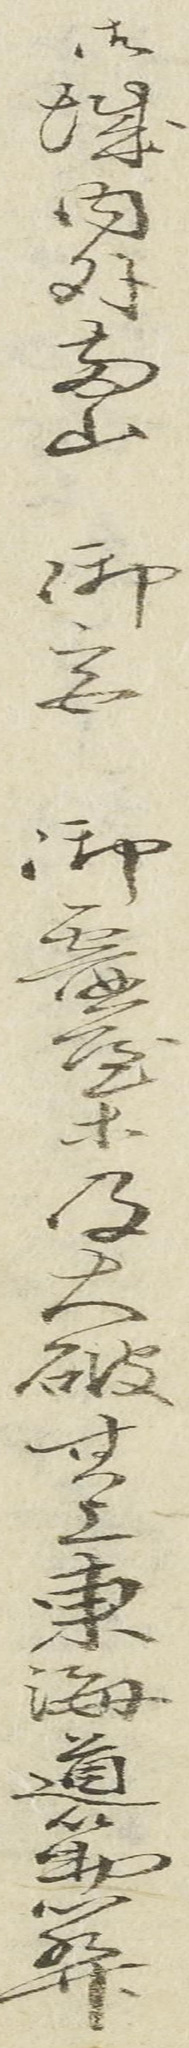御城内外両山御宮御霊屋等及大破其上東海道筋関
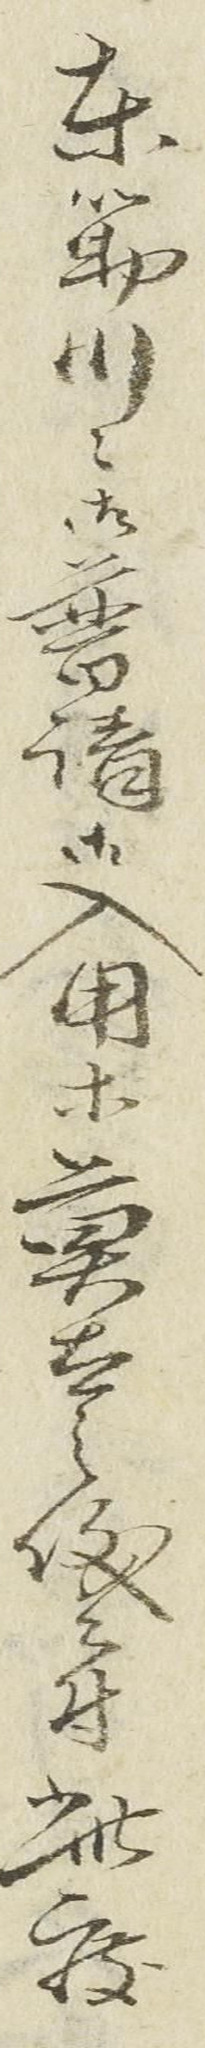東筋川々御普請御入用等莫太の儀二付此度
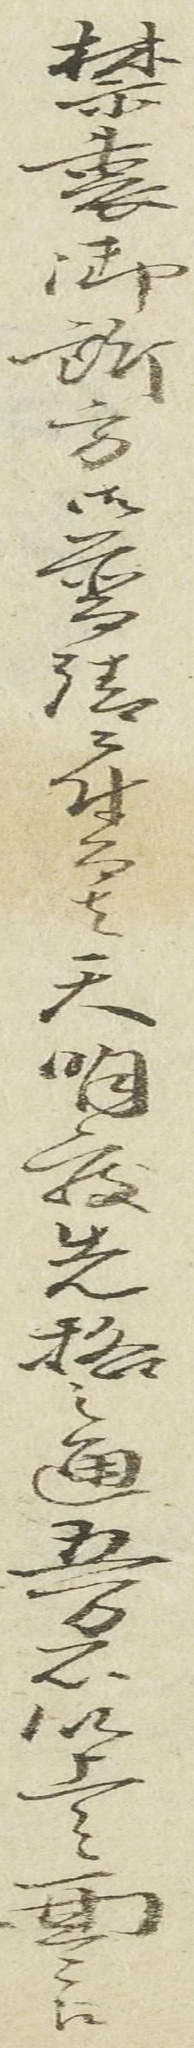禁裏御所方御普請に付ては天明度先格の通五万石以上之面々え
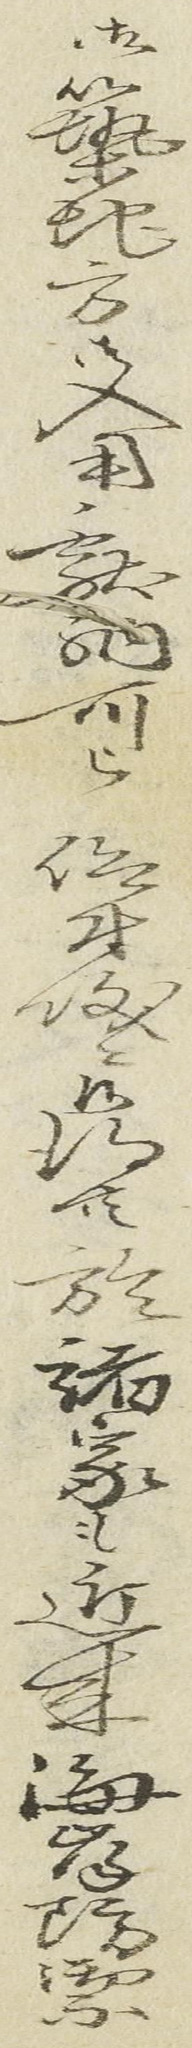御築地方御入用献納可被仰付儀二候得共於諸家も近来海岸防禦
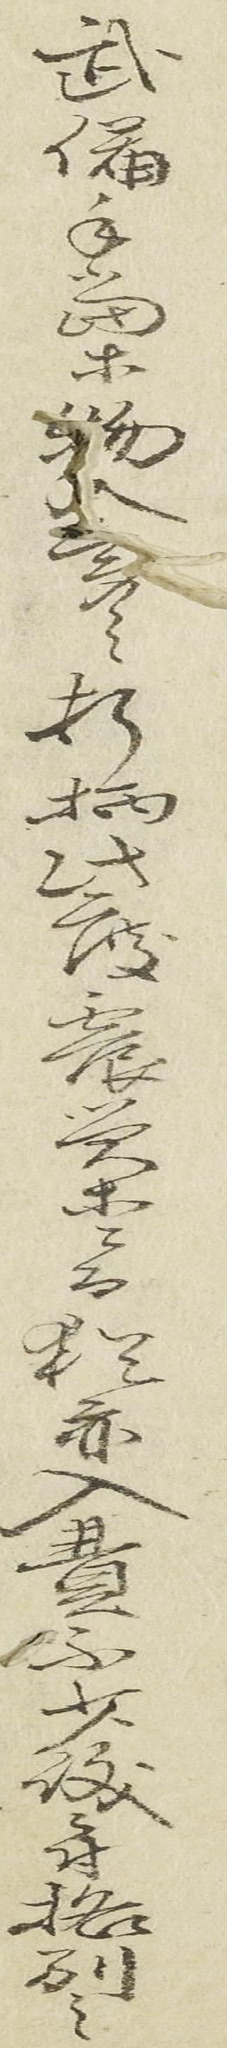武備手当等物入多之折柄此度震災等ニ而猶亦入費不少儀ニ付格別之

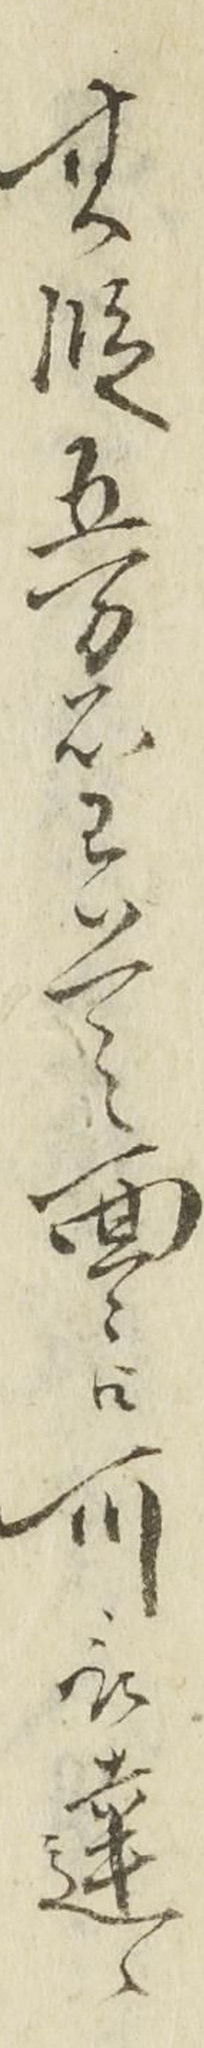其段五万石已上の面々え可被達候
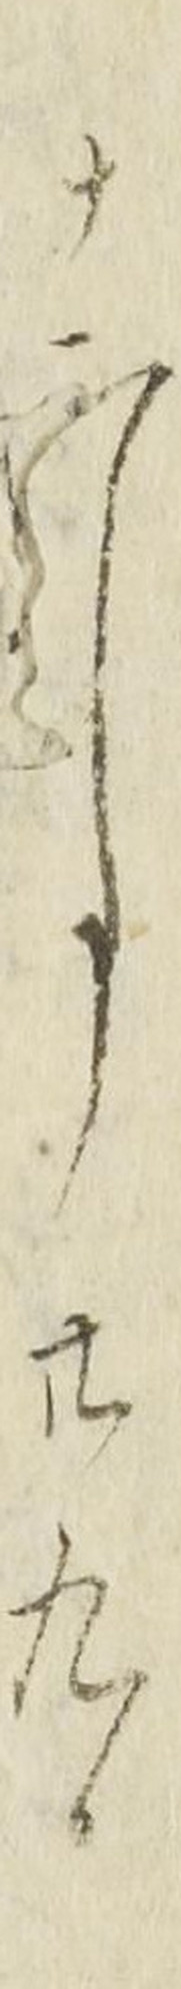十二月廿九日
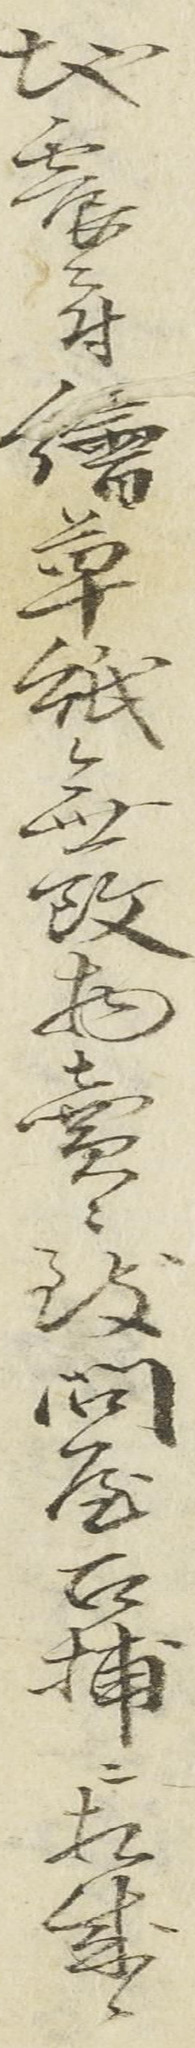地震二付絵草紙無改物売二致問屋召捕二相成候
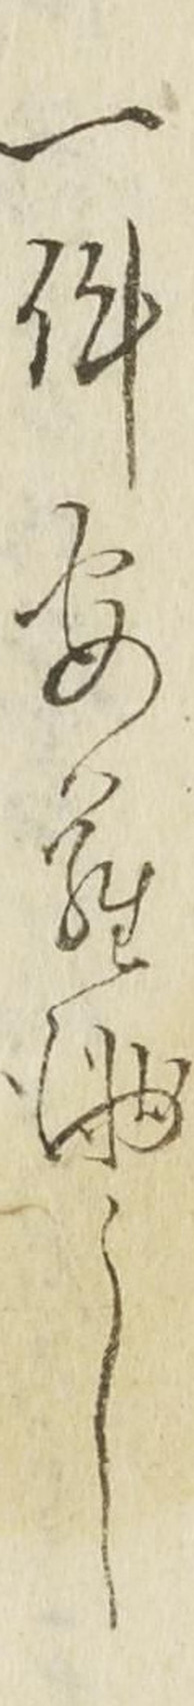一件安羅満し
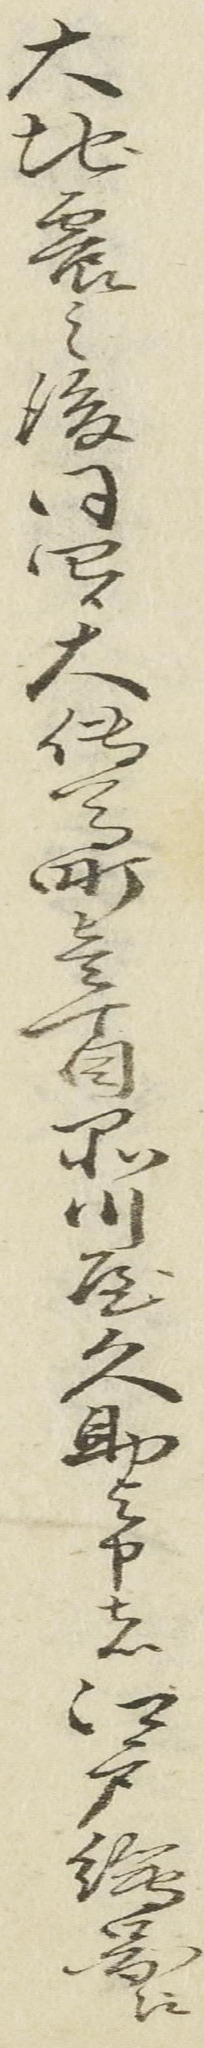大地震之後同四日大伝馬町壱丁目品川屋久助と申者江戸絵図え
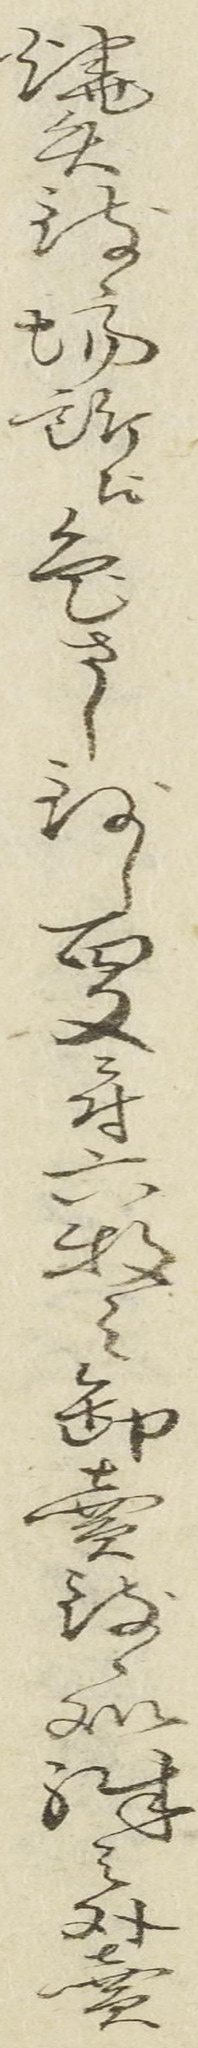焼失致候場所え色さし致し百文ニ付六枚之卸売致候処殊之外売
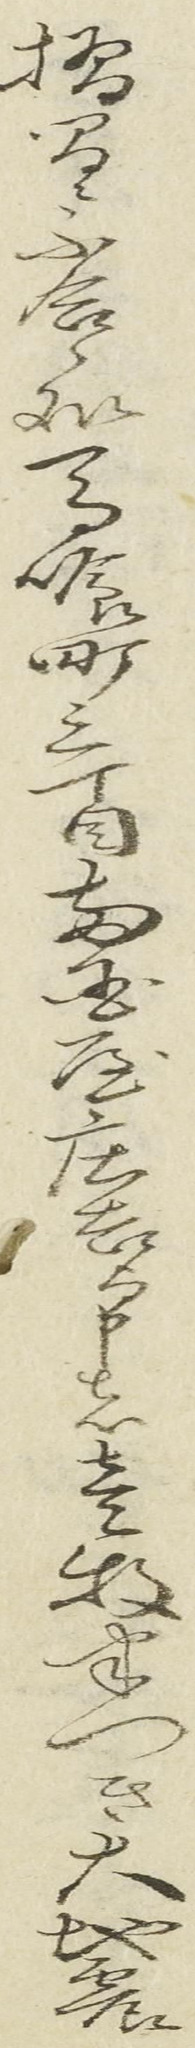摺間ニ不合候処馬喰町三丁目両国屋庄吉と申者壱枚半つき大地震
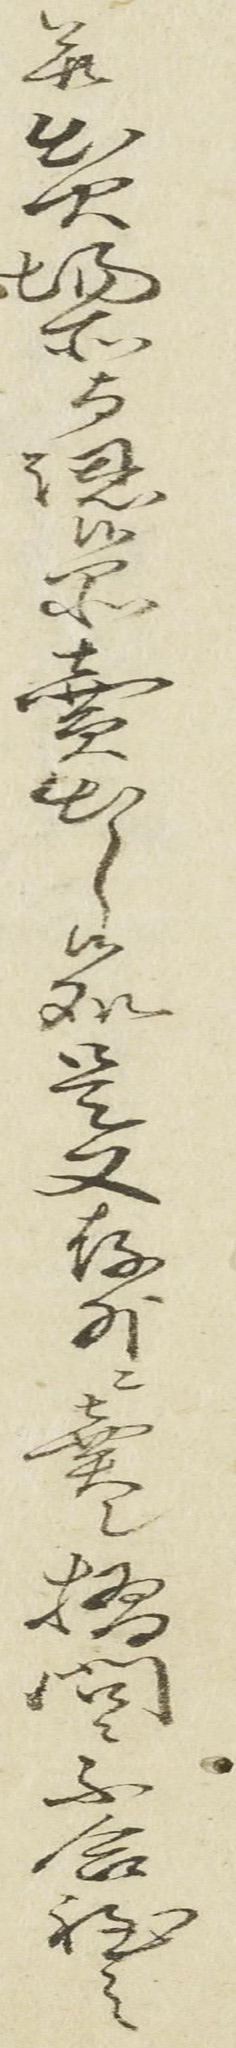幷出火場所と認候品売出し候処是又存外ニ売レ摺間ニ不合程の
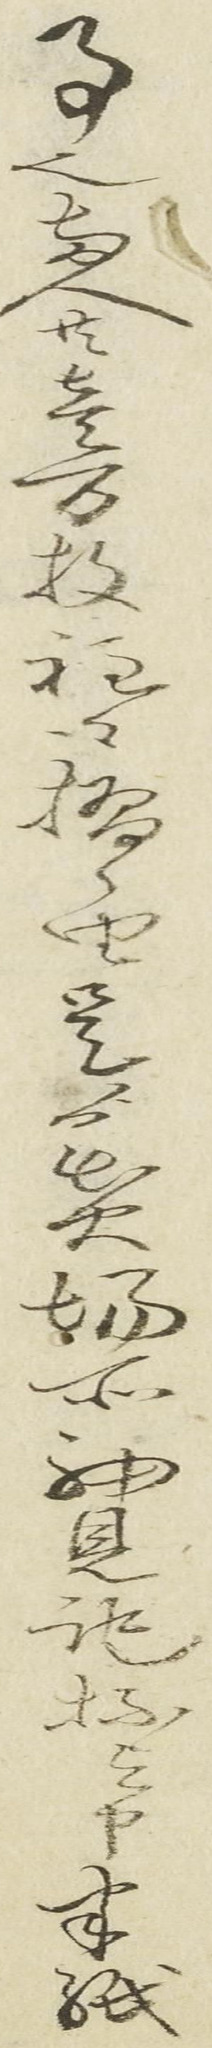事也両人共壱万枚程御摺候由是ゟ出火場所拝見記抔と申半紙
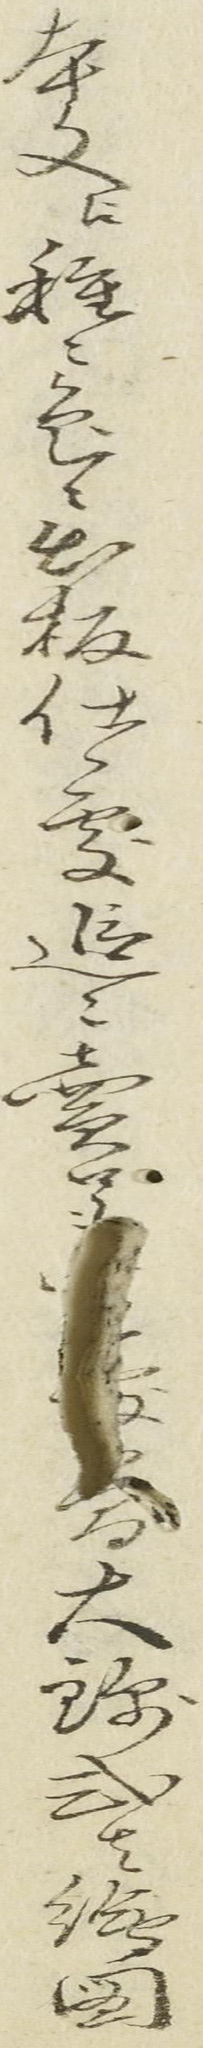本文え種々色々出板仕候処追々売口も間大錦式は絵図
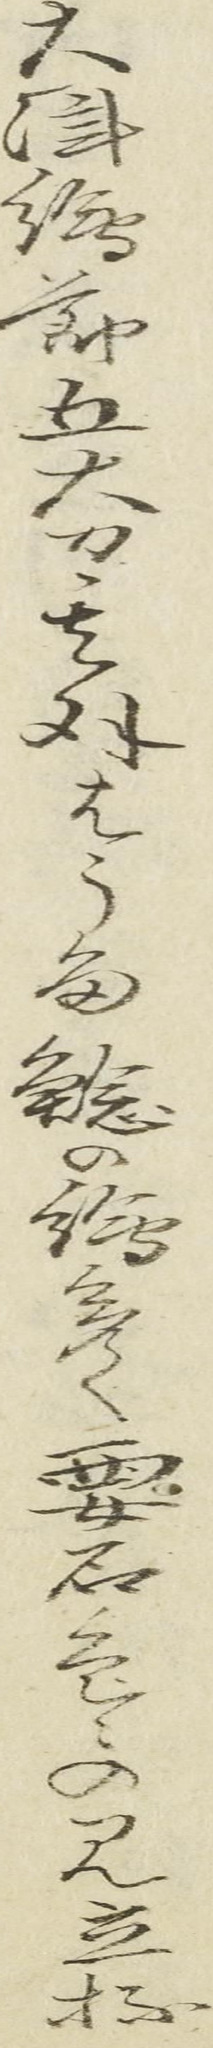大津絵節御大力其外はうた鯰の絵多く要石ノ色々の見立抔
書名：安政二乙卯年十月二日大地震之事
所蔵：東京大学地震研究所図書室 Earthquake Research Institute Library, The University of Tokyo, JAPAN
